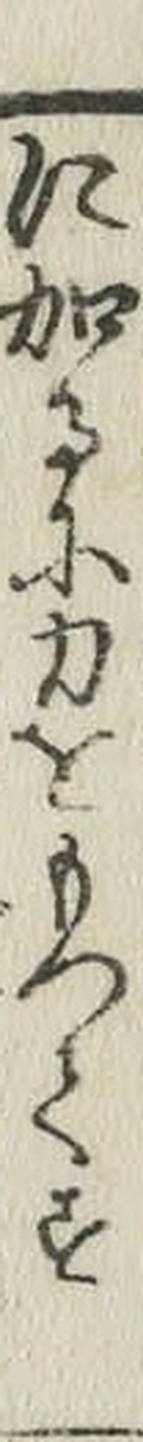に加る小力をもつてす
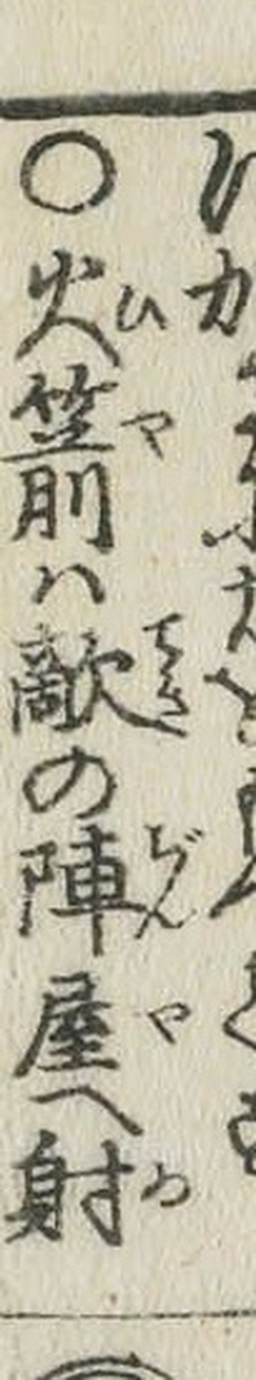○火箭は敵の陣屋へ射
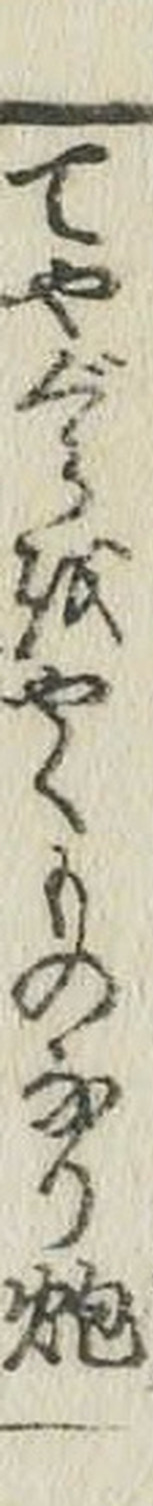てやぐらをやくものなり炮
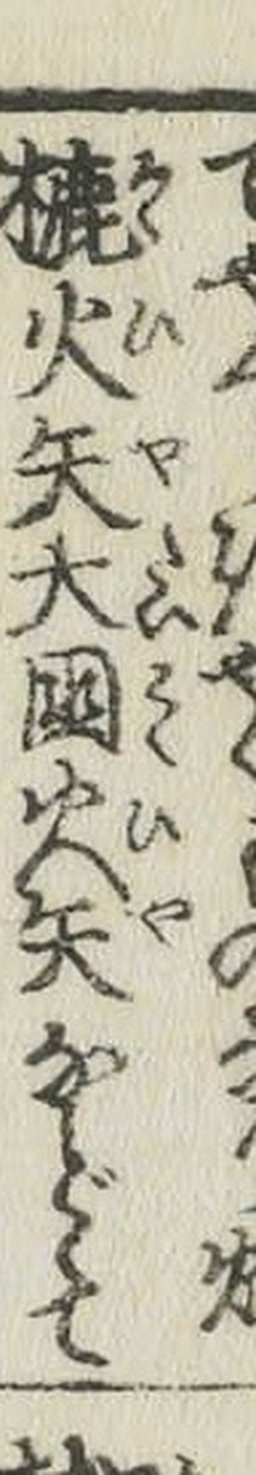樚火矢大国火矢などゝて
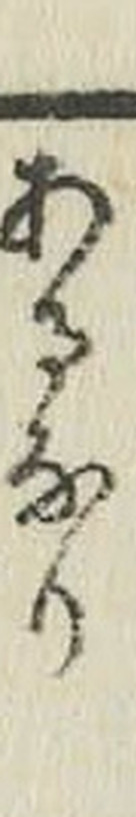あるなり
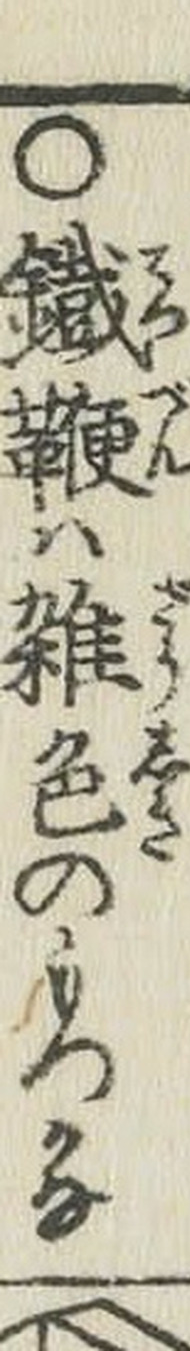○鉄鞭は雑色のもつかな
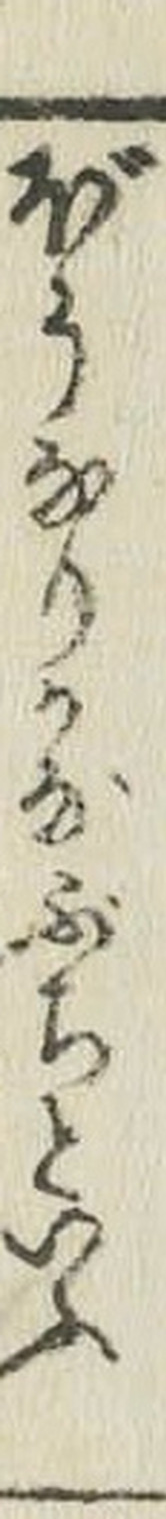ぼうなりかなぶちといふ
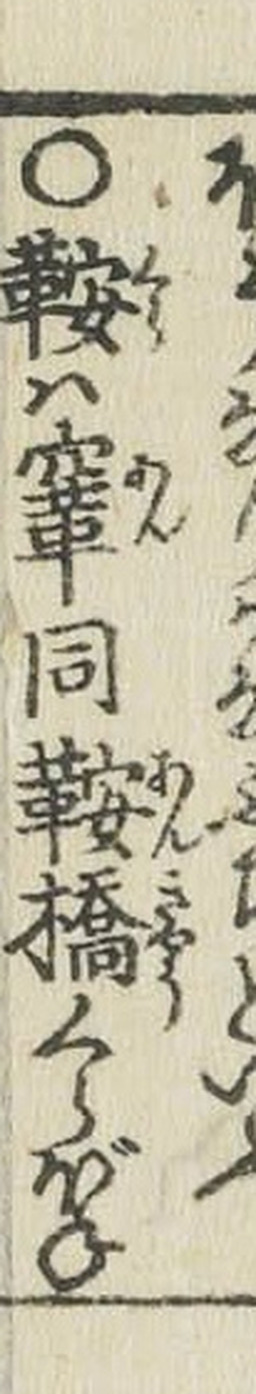○鞍は鞌同鞍橋くらぼね
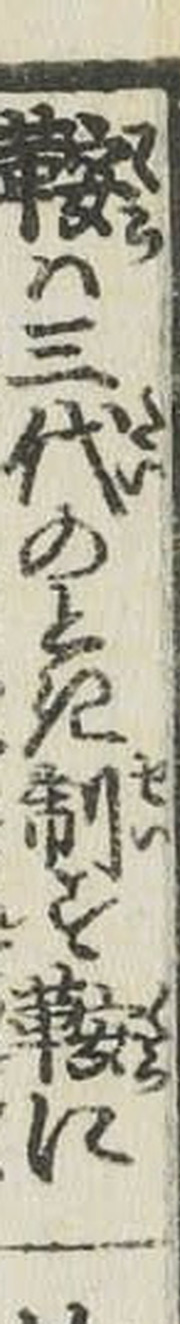鞍は三代のとき制す鞍に
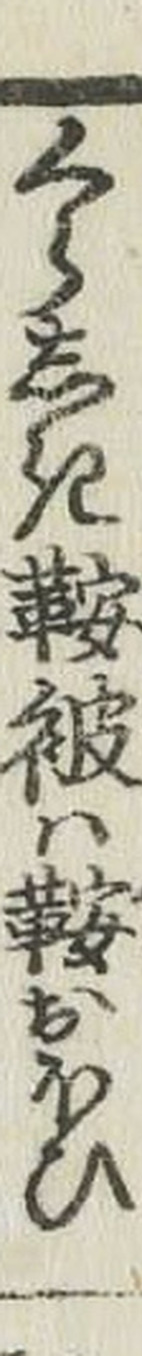くらしき鞍被は鞍おほひ
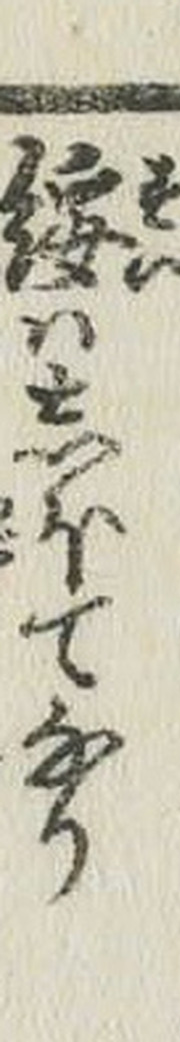綏はしほてなり。
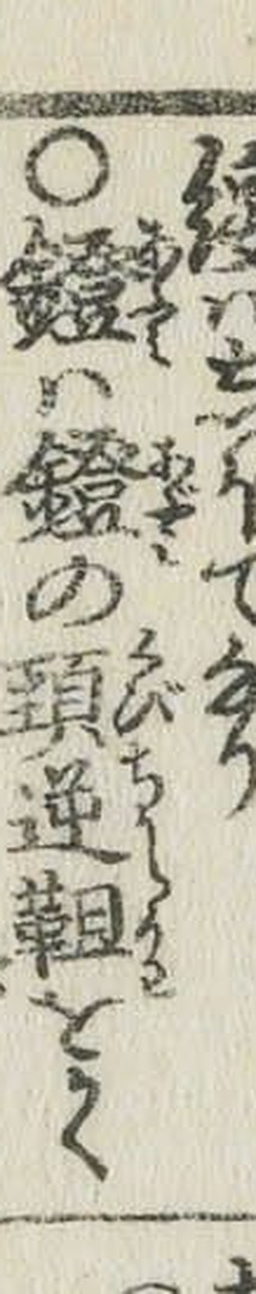○鐙は鐙の頸逆靻をかく
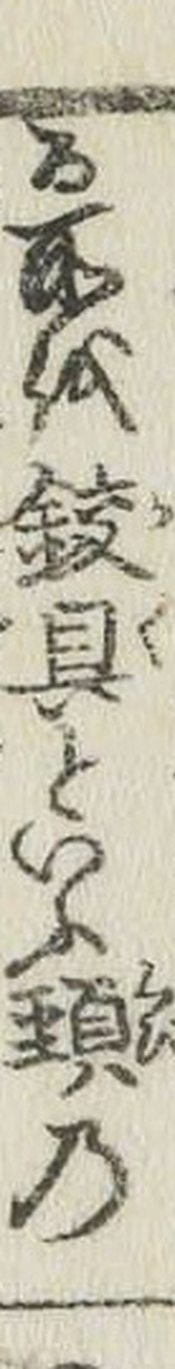る所を鉸具といふ頸の
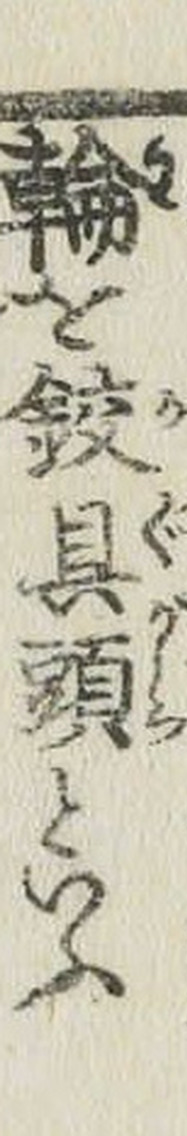輪を鉸具頭といふ
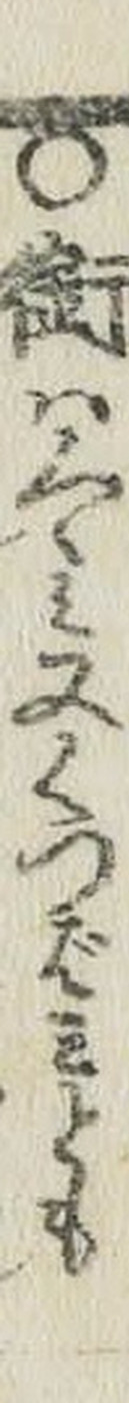○銜はくゝみ又くつばみとも
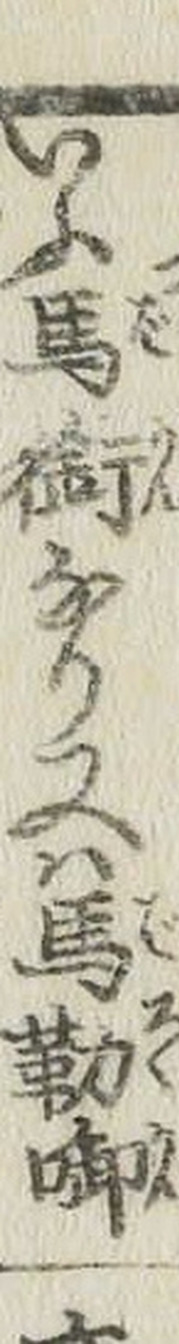いふ馬銜なり又は馬勒啣
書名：増補頭書訓蒙図彙大成 10巻 5:巻之9-11
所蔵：東京学芸大学教育コンテンツアーカイブ
